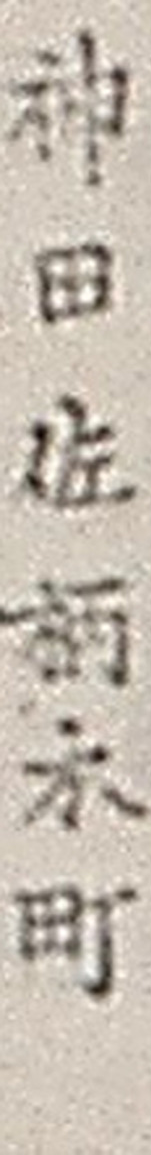神田佐柄木町

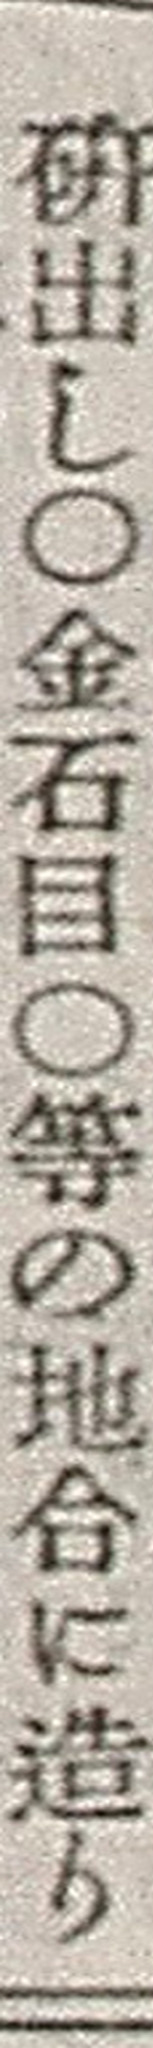研出し○金石目○等の地合に造り
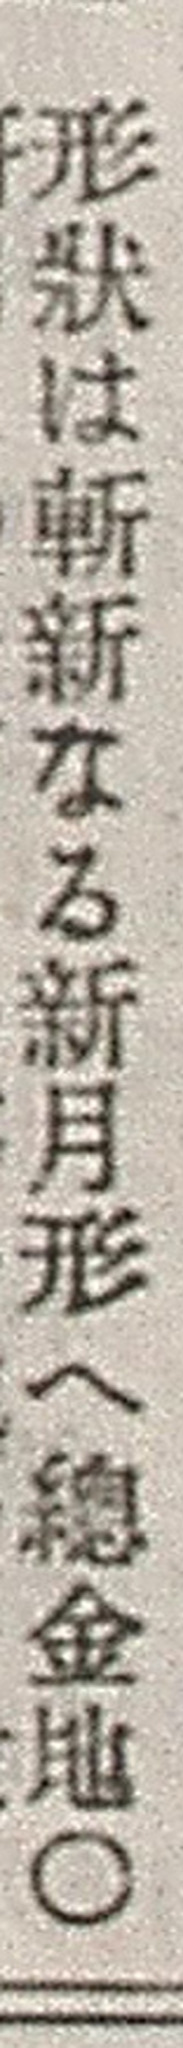形状は斬新なる新月形へ総金地○
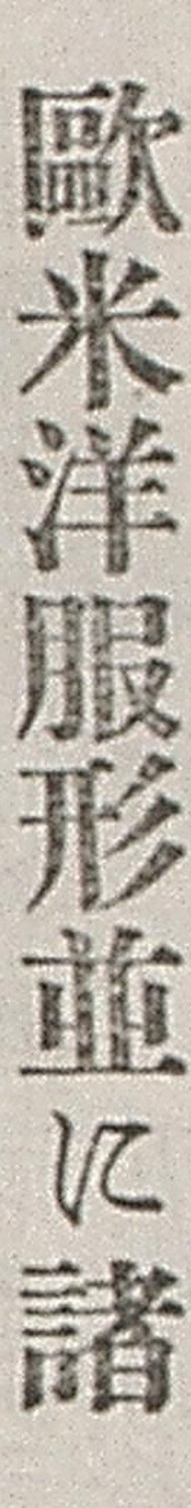欧米洋服形並に諸
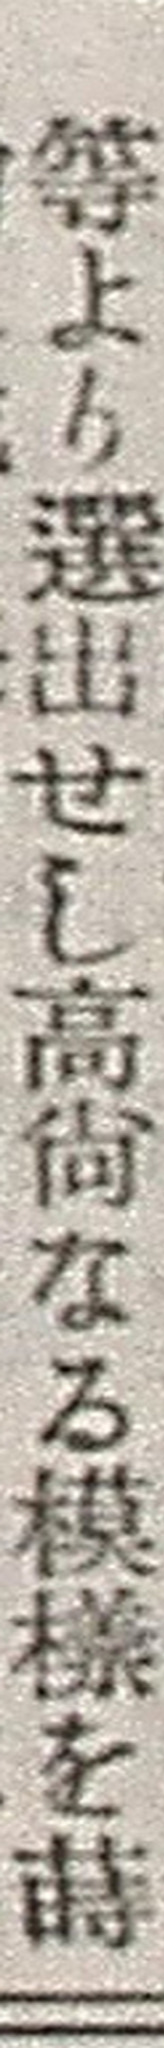等より選出せし高尚なる模様を蒔
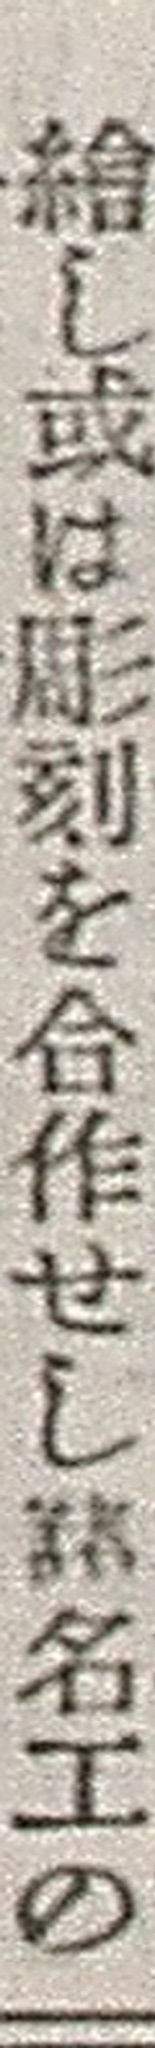絵し或は彫刻を合作せし諸名工の
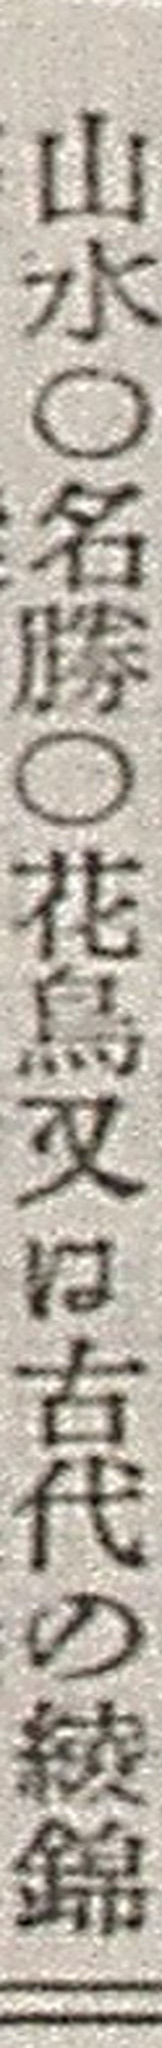山水○名勝○花鳥又は古代の綾錦
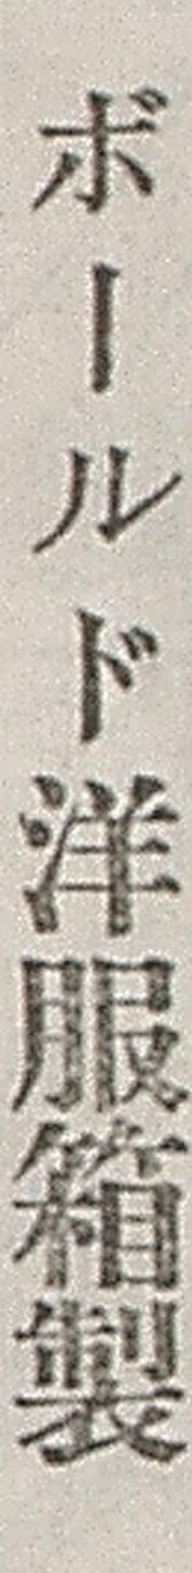ボールド洋服箱製
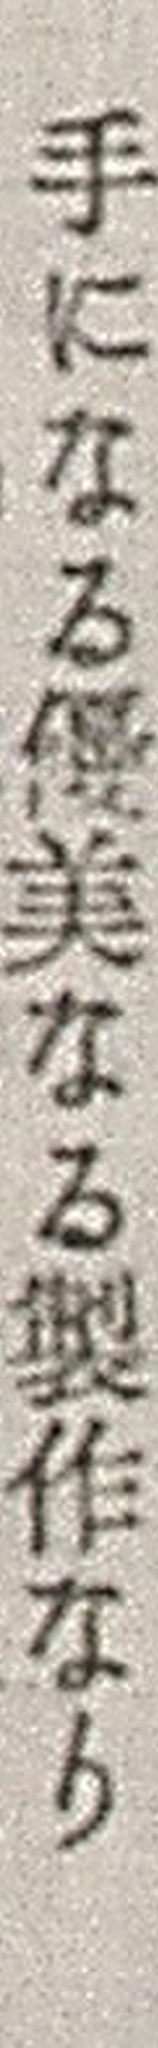手になる優美なる製作なり
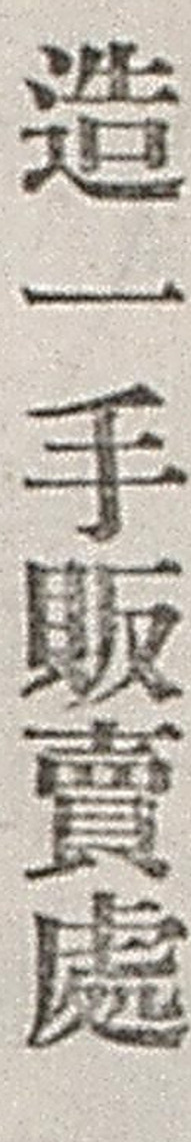造一手販売処
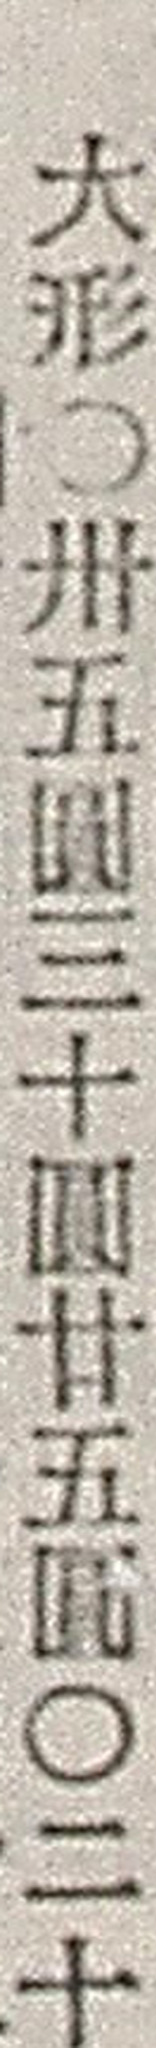大形○丗五円三十円廿五円○二十
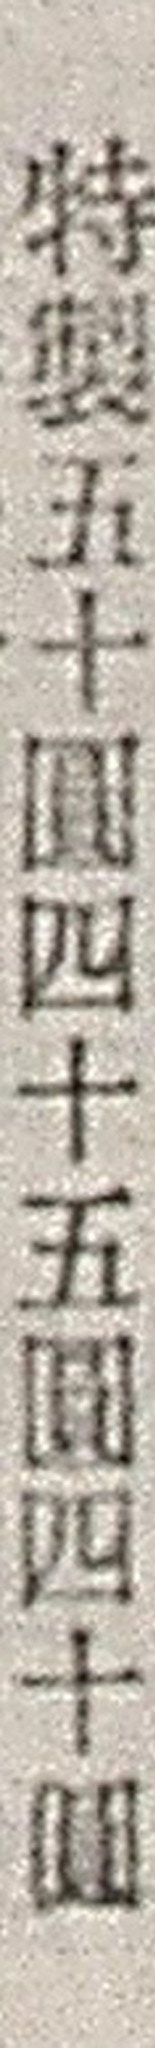特製五十円四十五円四十円
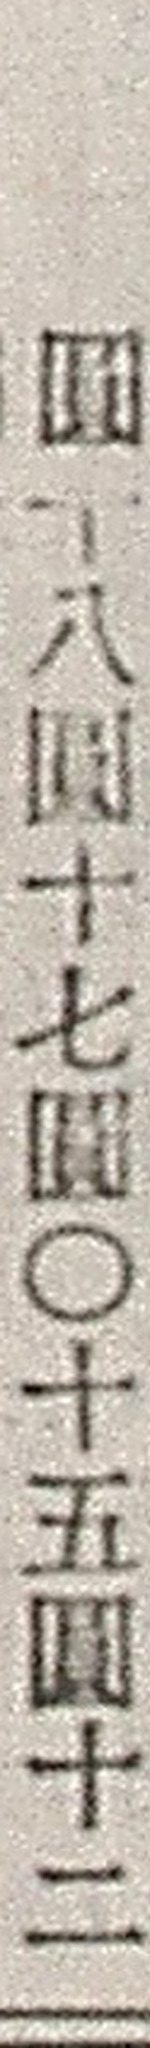円十八円十七円○十五円十二
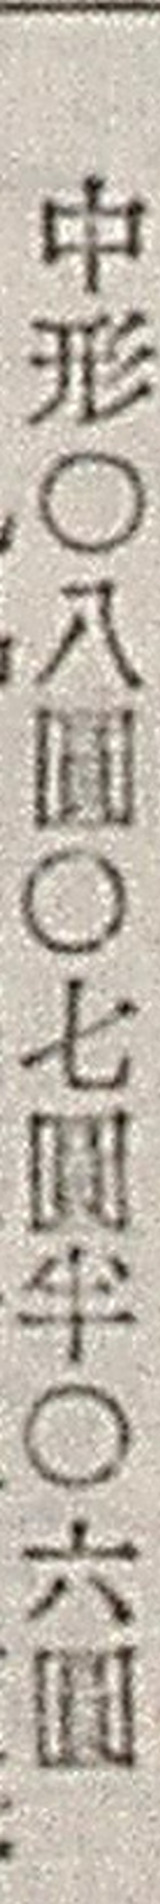中形○八円○七円半○六円
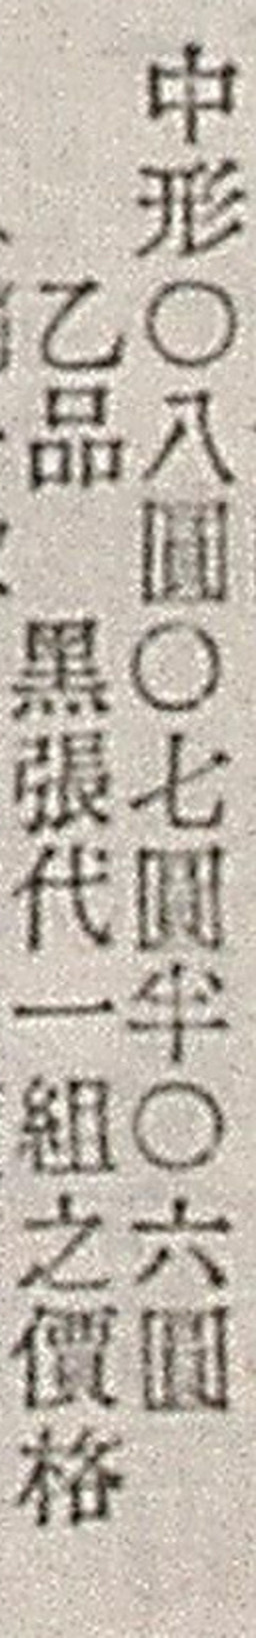乙品黒張代一組之価格
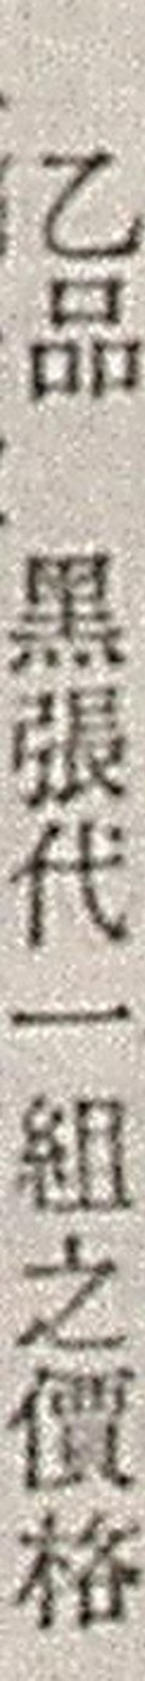乙品黒張代一組之価格
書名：風俗畫報臨時増刊第百九十九號　明治三十二年十月各地災害圖會（前編之續）
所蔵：東京大学地震研究所図書室 Earthquake Research Institute Library, The University of Tokyo, JAPAN
